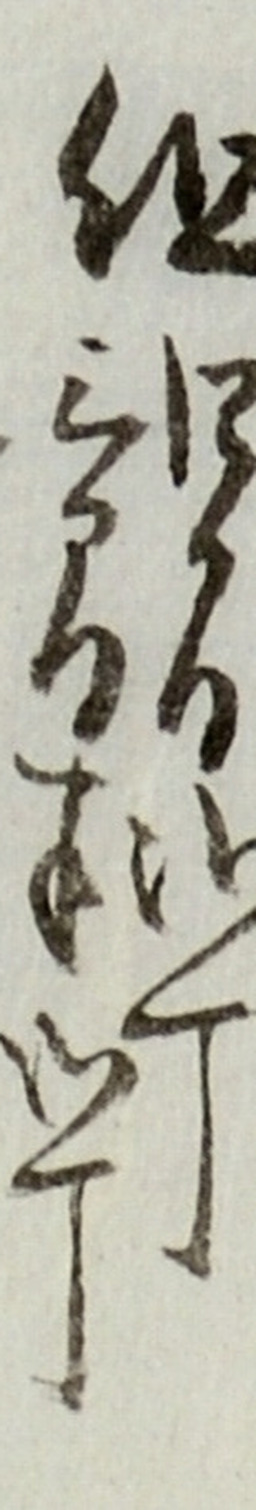三間半弐丁
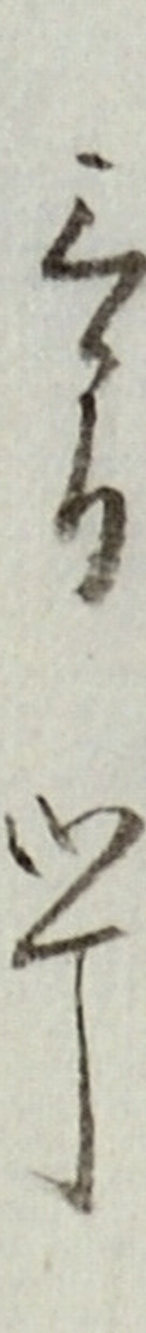三間弐丁
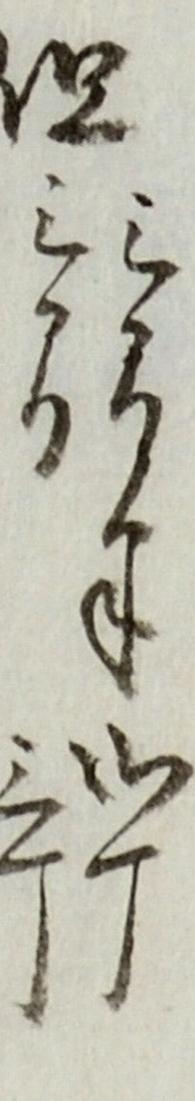三間半弐丁
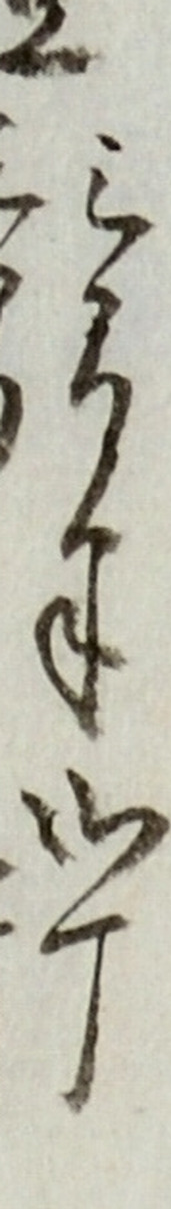三間半弐丁
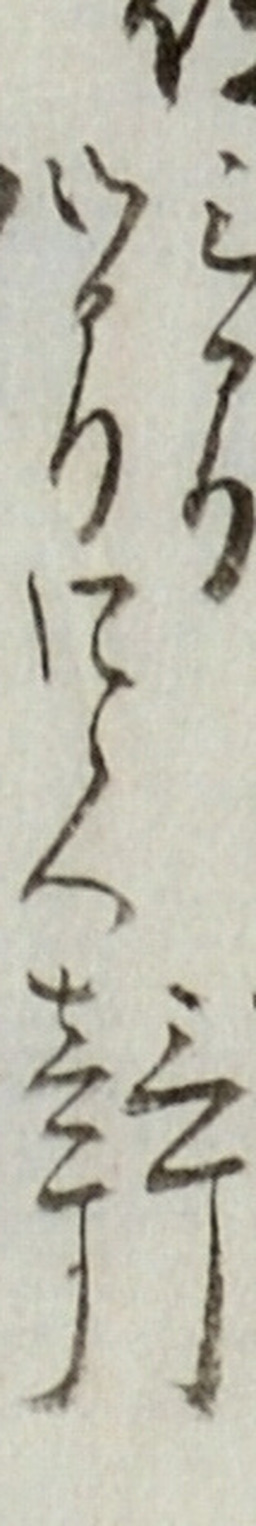弐間四尺壱丁
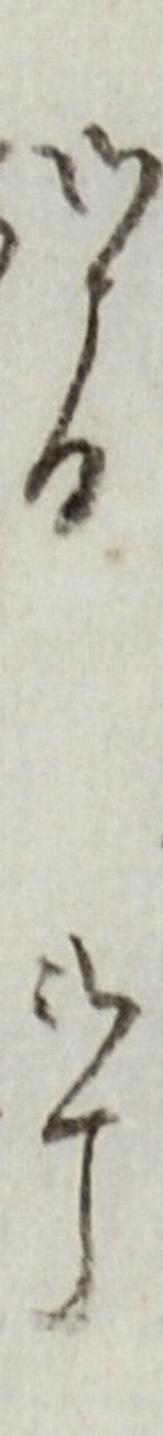弐間弐丁
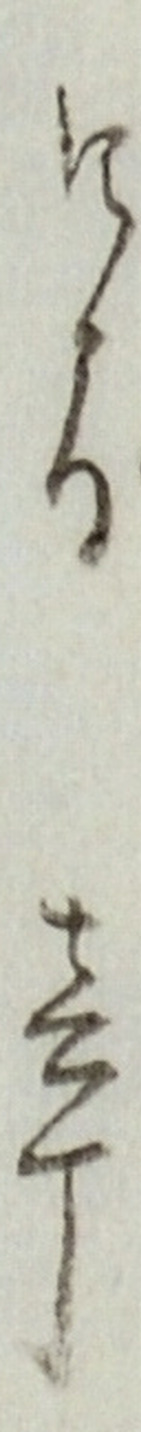四間壱丁
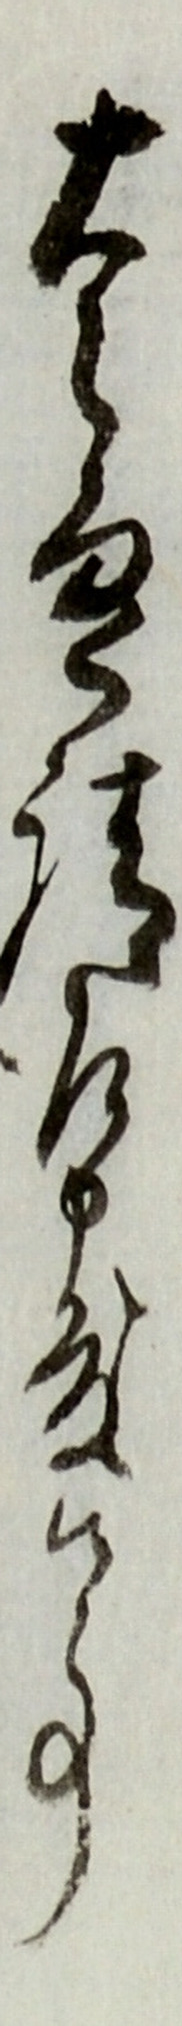右之通請取申度候事

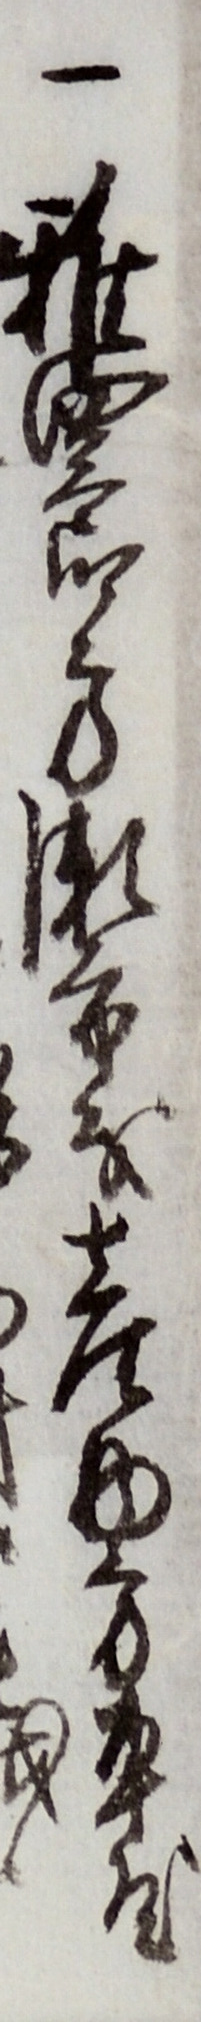一雅四郎方瀬市義産物方車屋
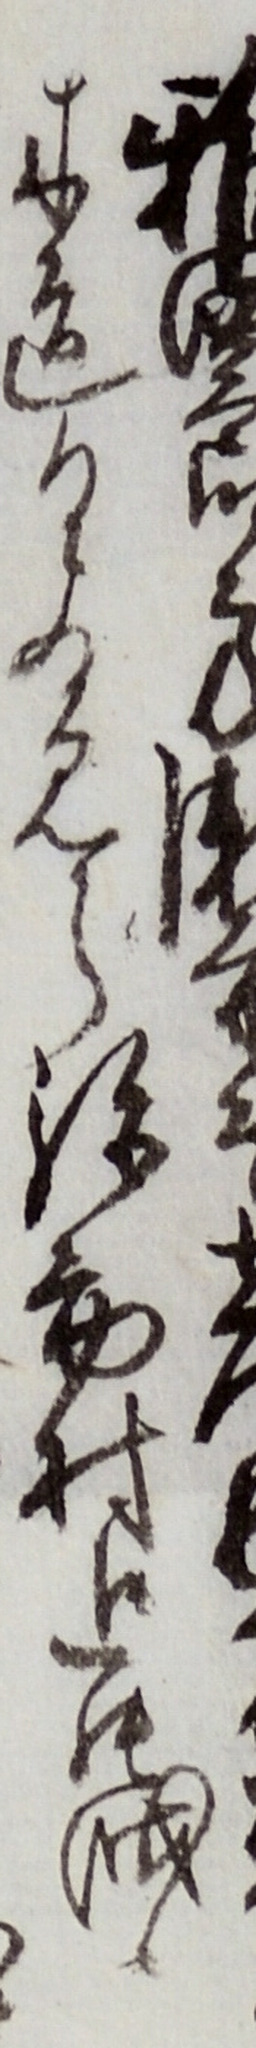木道具為見分弥勒村江罷越候
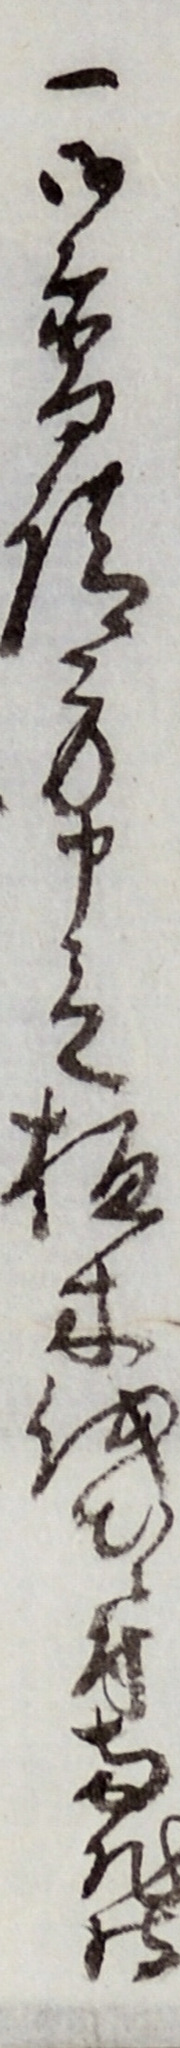一御普請方申立樋木伐出ニ付両非持
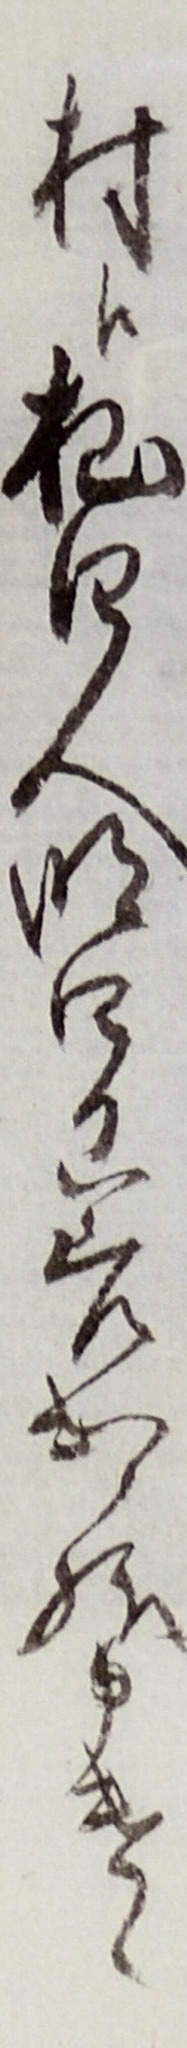村江杣四人明四日差出候様申遣候
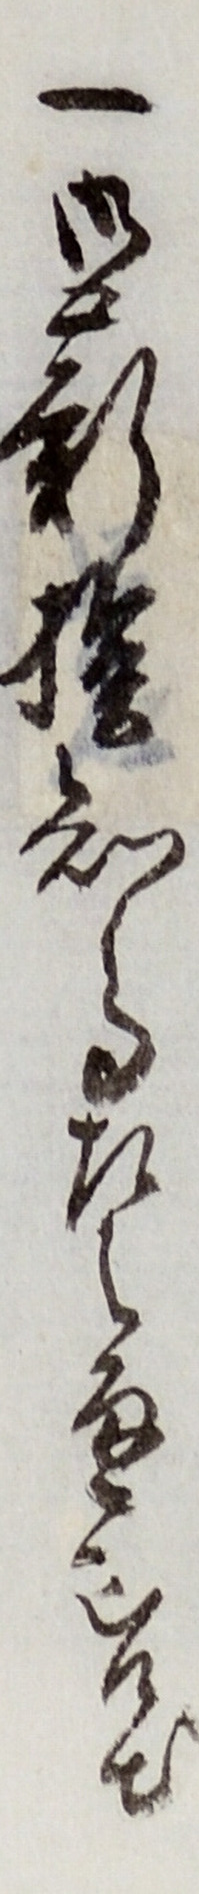一御薪検知高左之通差出
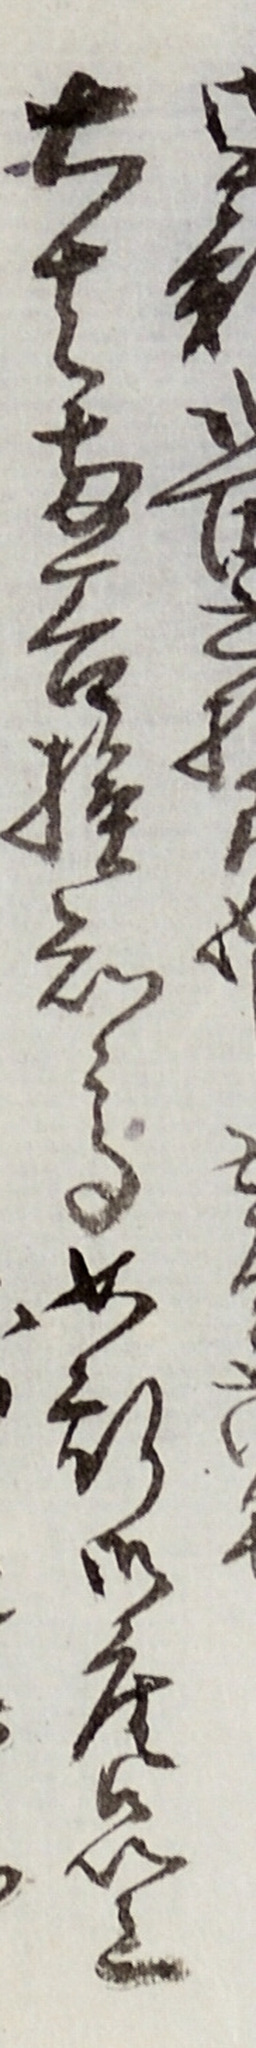右者両谷検知高如斯御座候以上
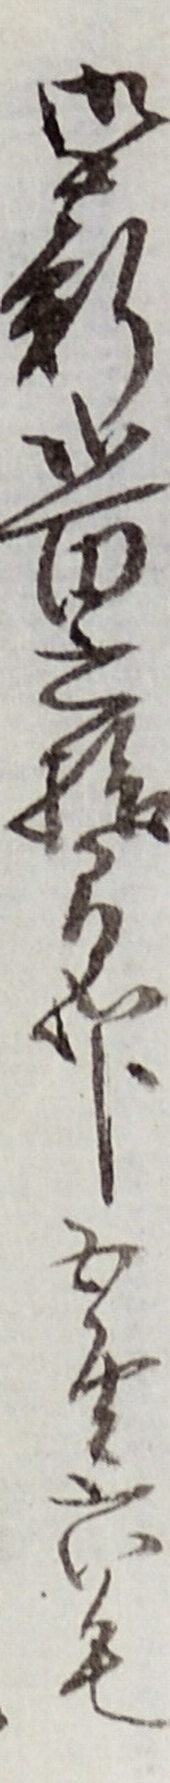御薪弐百六拾間弐歩五厘六毛
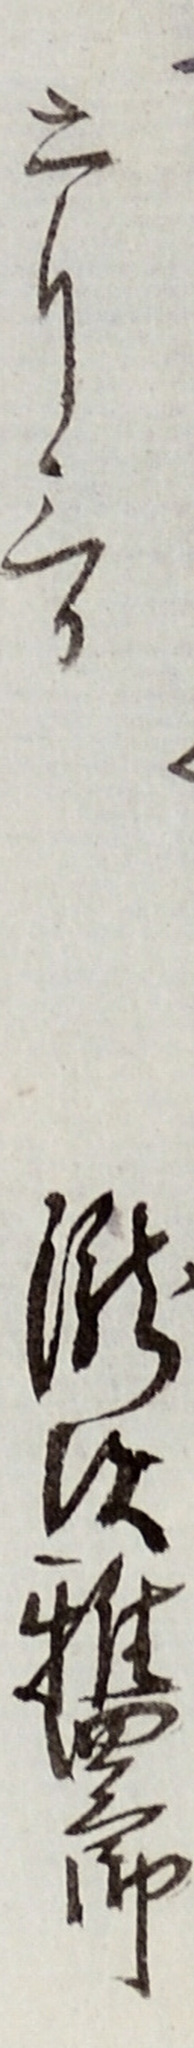六月三日瀧沢雅四郎
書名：御山方御薪方諸事御用留
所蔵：伊那市立高遠町図書館・合同会社AMANE
